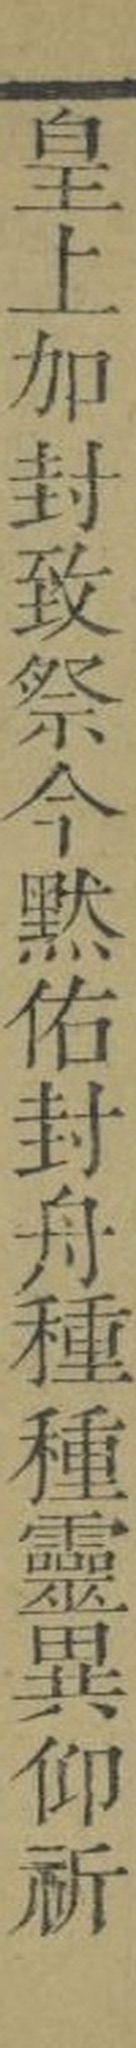皇上加封致祭今默佑封舟種種靈異仰祈
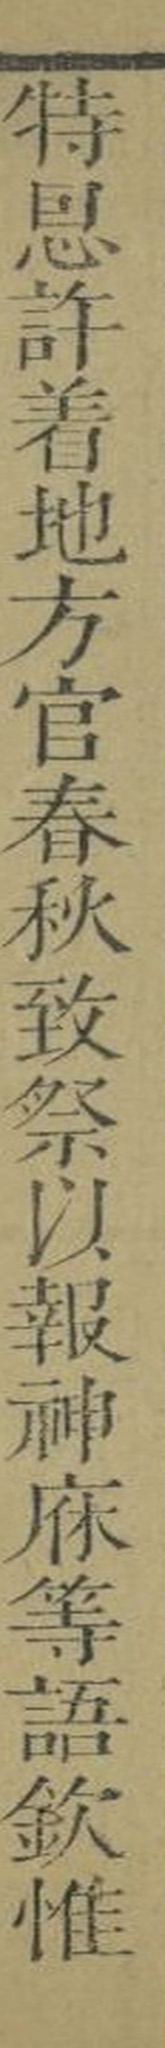特㤙許着地方官春秋致祭以報神庥等語欽惟
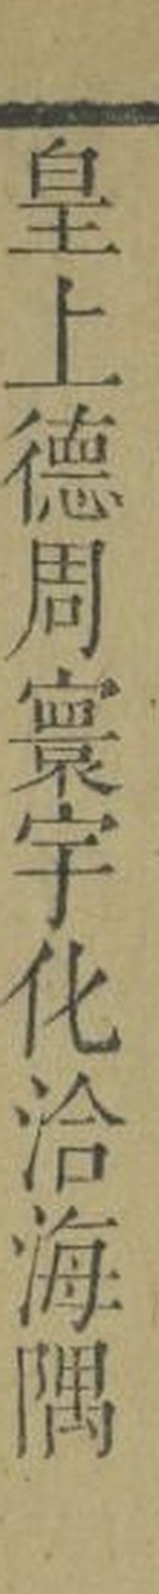皇上德周寰宇化洽海隅
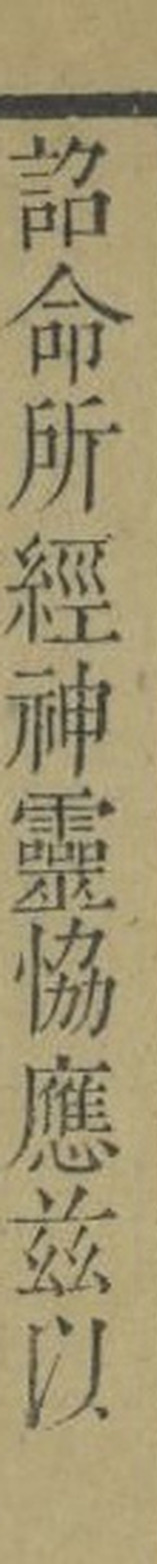詔命所經神靈恊應茲以
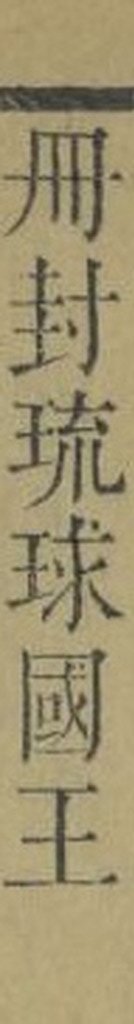冊封琉球國王
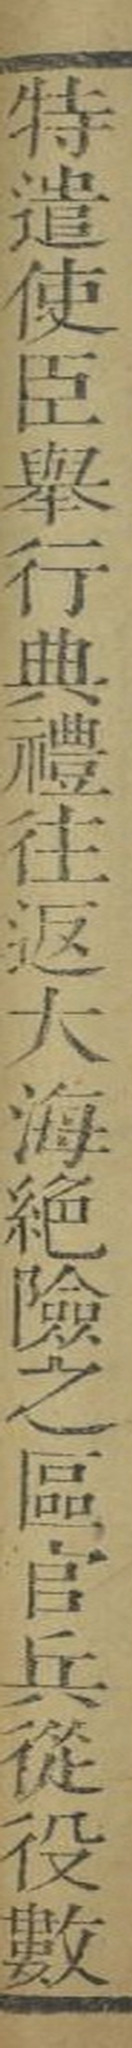特遣使臣舉行典禮往返大海絶險之區官兵從役數
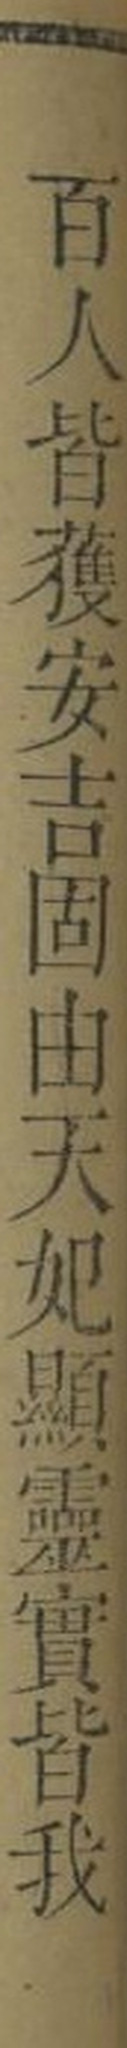百人皆獲安吉固由天妃顯靈實皆我
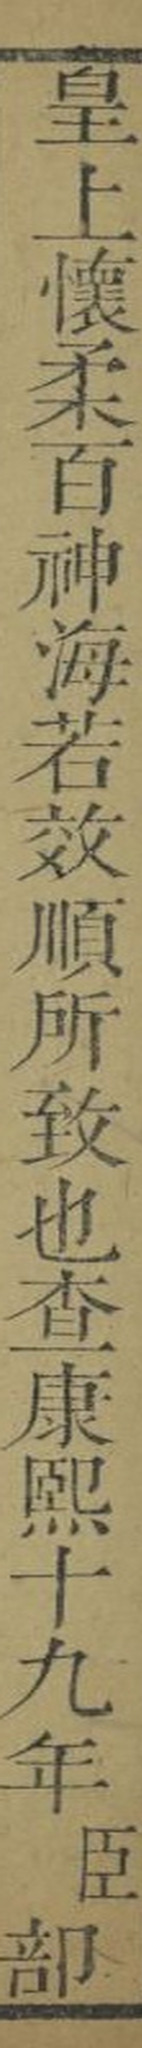皇上懷柔百神海若效順所致也查康熙十九年臣部
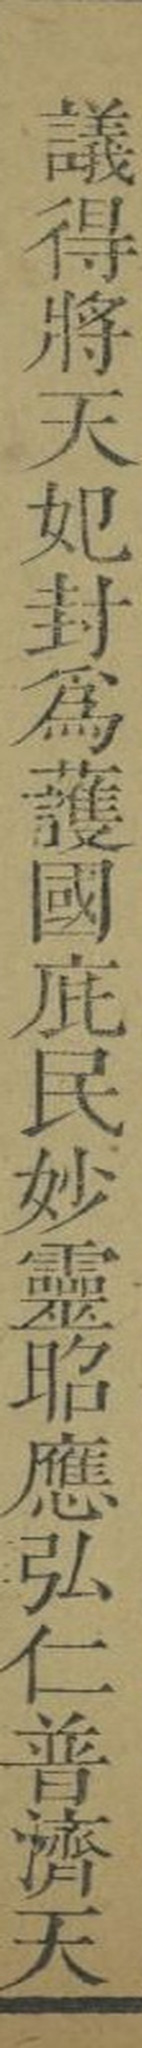議得將天妃封爲䕶國庇民妙靈昭應弘仁普濟天
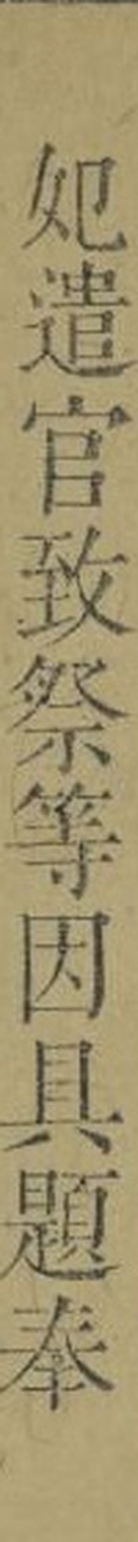妃遣官致祭等因具題奉
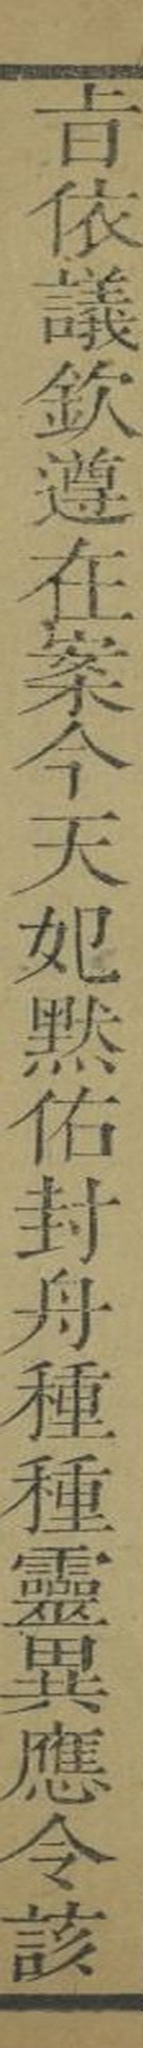㫖依議欽遵在案今天妃默佑封舟種種靈異應令該
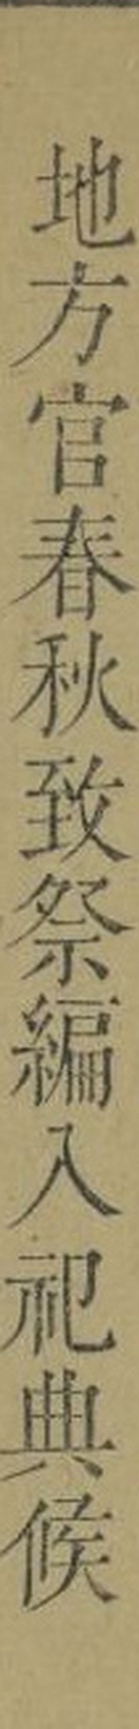地方官春秋致祭編入祀典候
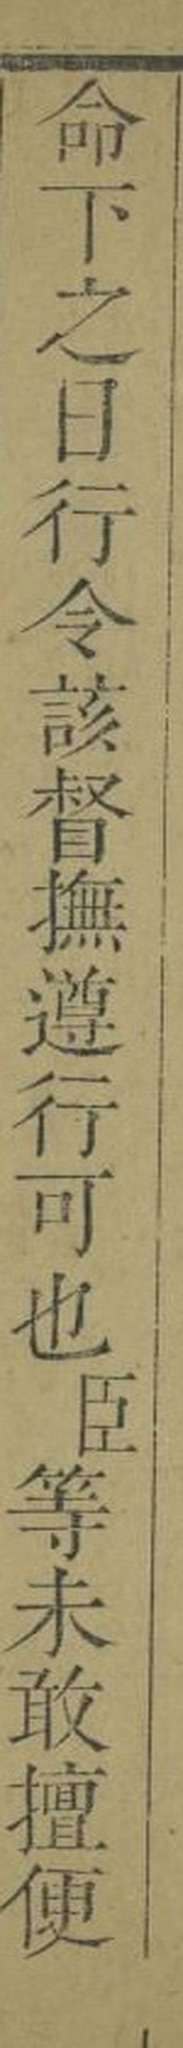命下之日行令該督撫遵行可也臣等未敢擅便
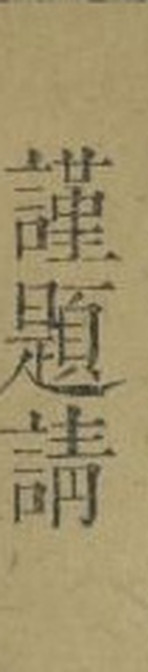謹題請
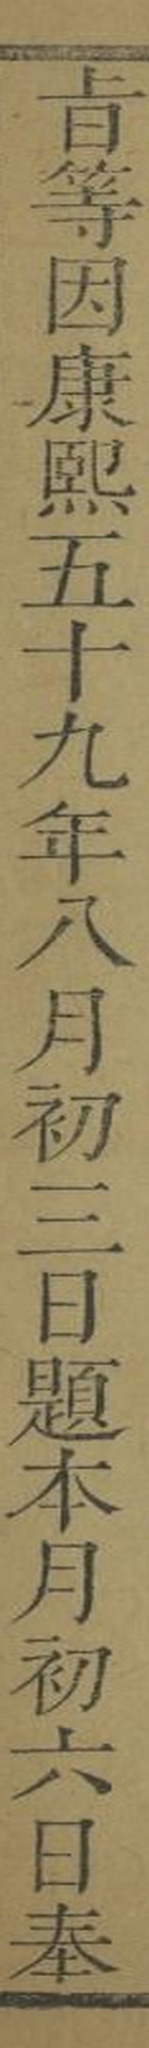㫖等因康熙五十九年八月初三日題本月初六日奉

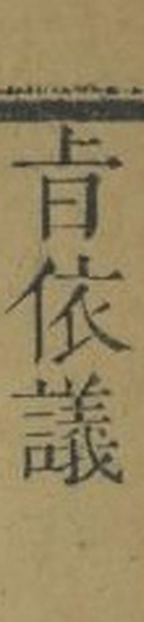㫖依議
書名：中山伝信録 巻一
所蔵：University of the Ryukyus Library
